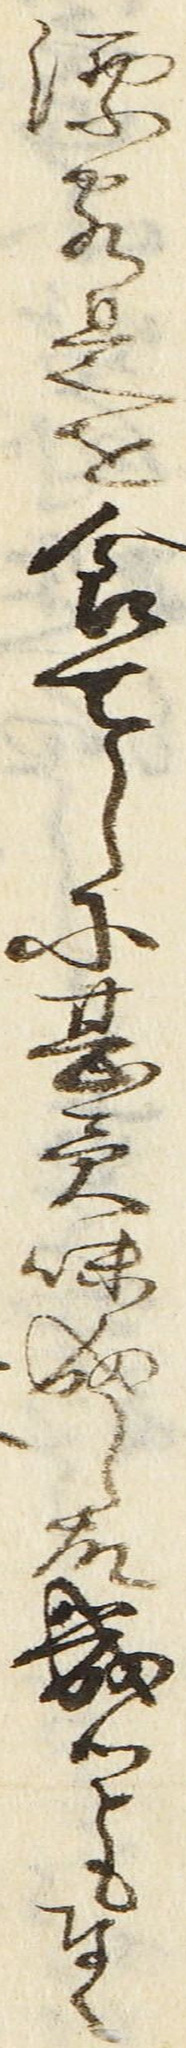漂客是を食せしに甚美味成し故幾ツともなく
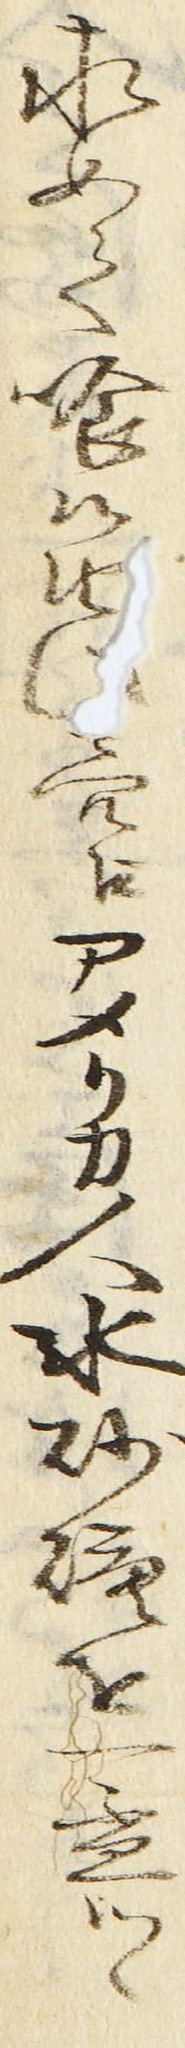求めて喰候江アメリカ人氷砂糖を一盃ツヽ

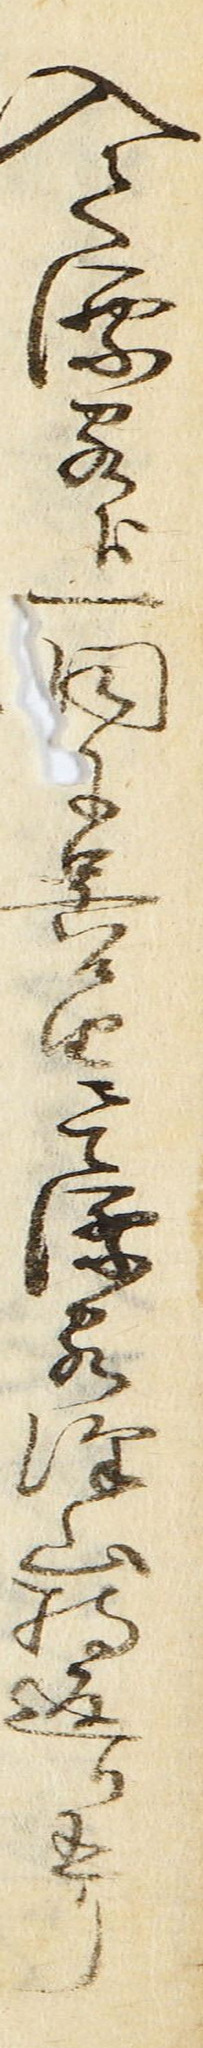入て漂客え一同に呉候由ニて漂客沢山持返り有り
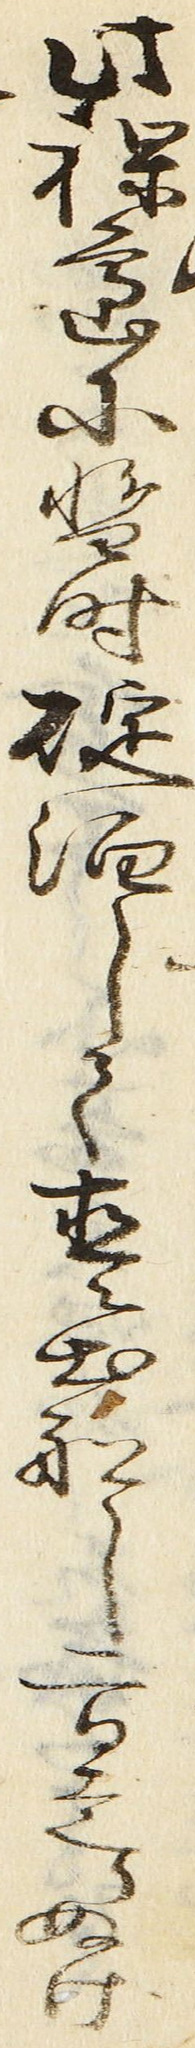此裸島に暫時碇泊して直ニ出船し二日走りぬけ
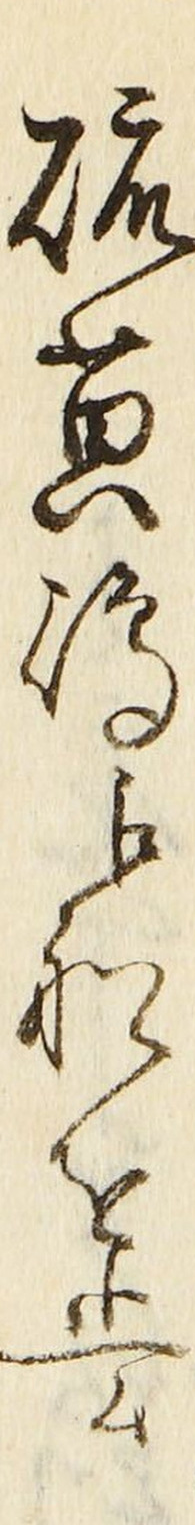硫黄島え船を止ム
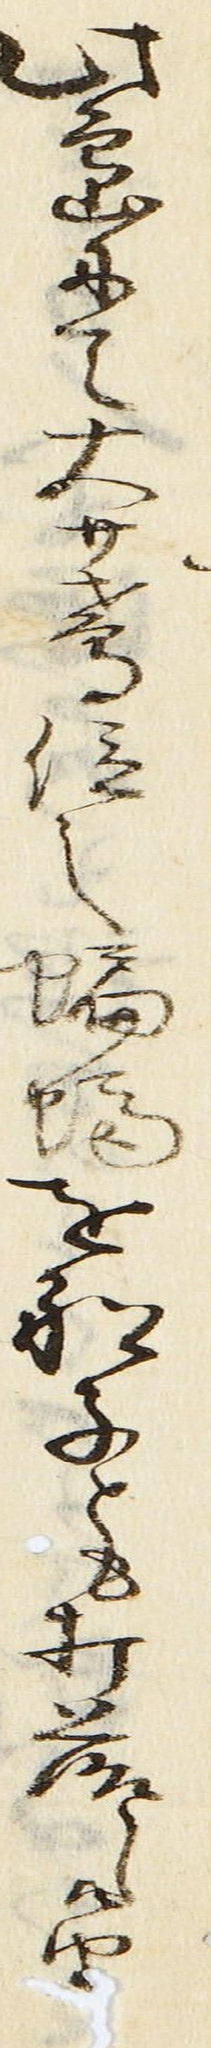此島にて大サ鳶位之蝙蝠を船子とも打落し候由
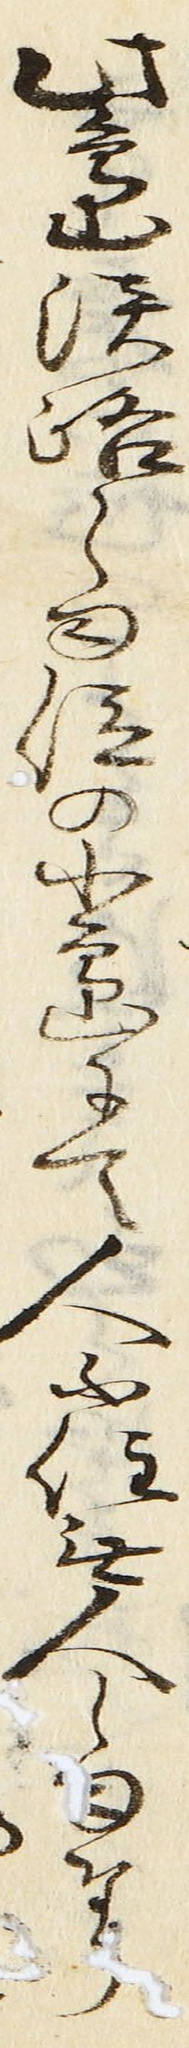此島淡路の内位の小島にて人不住無人之内なり
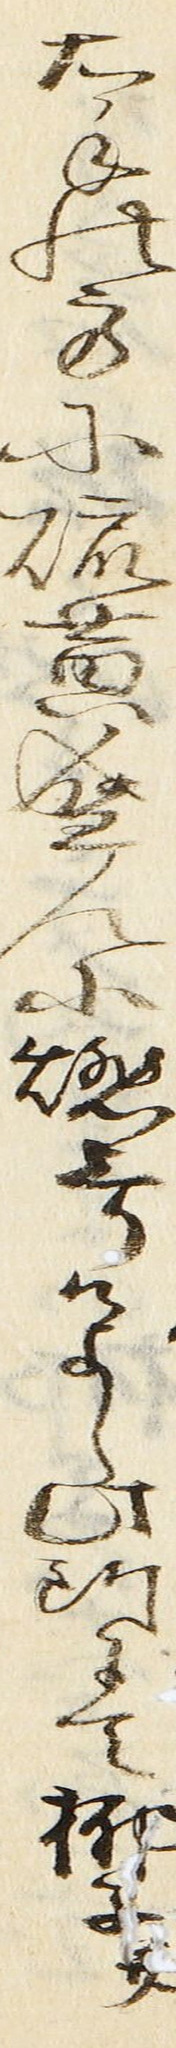右手の方に硫黄盛んに燃上り候よし此所にて椰子并
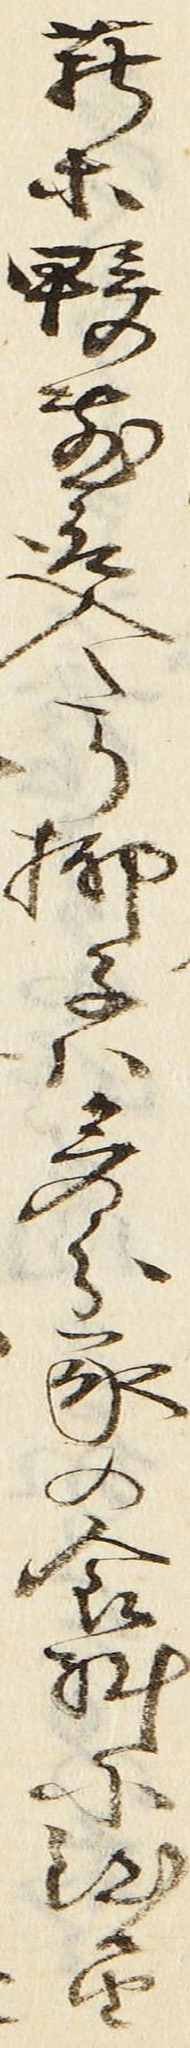薪等夥敷取入たり椰子ハ多分豕の食料に致候由
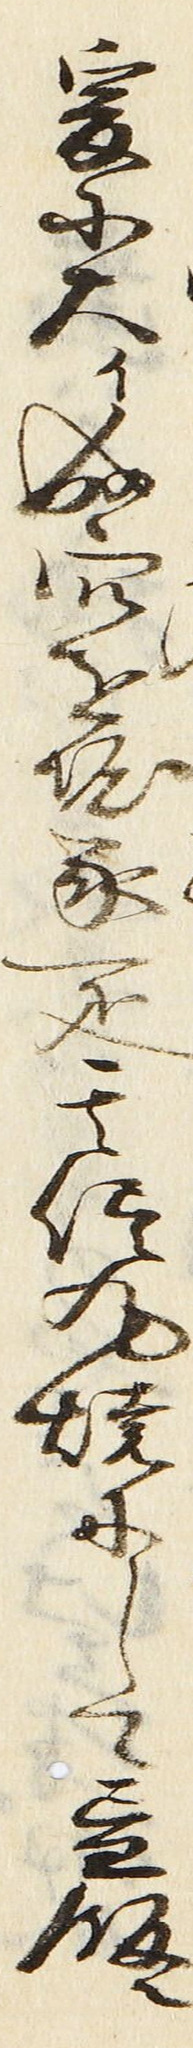爰に大イ成穴を掘豕一疋其儘丸焼にして昼飯ニ
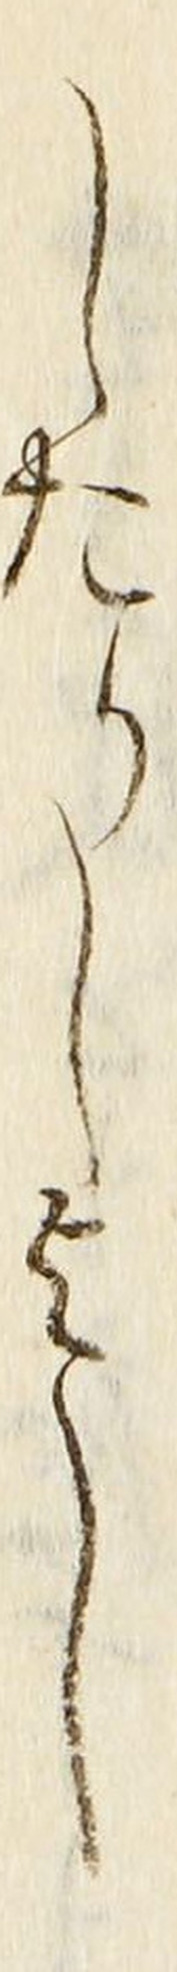したりしよし
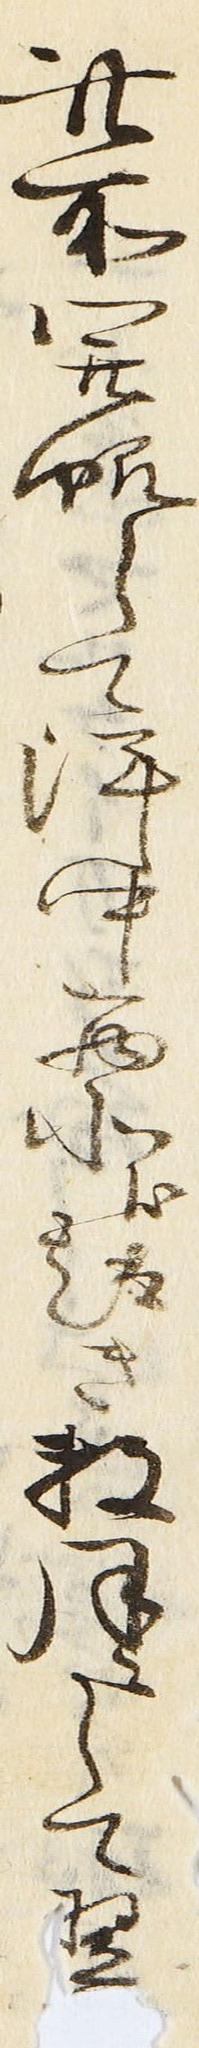此所開帆して洋中西北ゟ趣き数月ニして翌
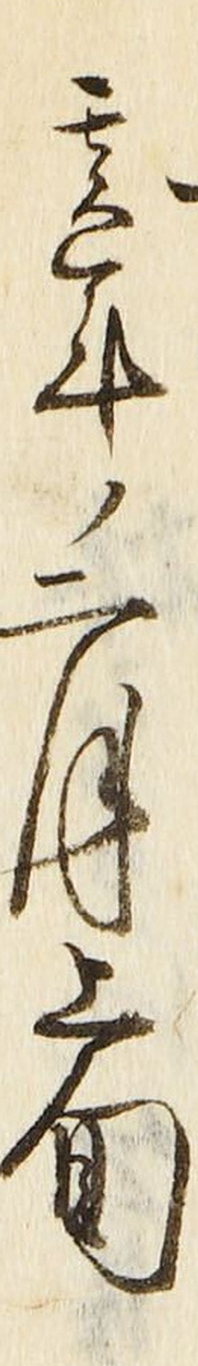亥年ノ二月上旬
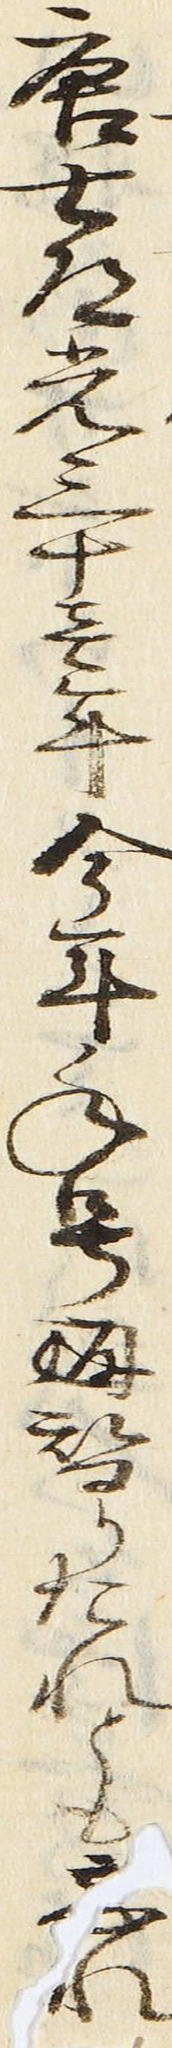唐土道光三十壱年今年年号替りたれとも忘れ
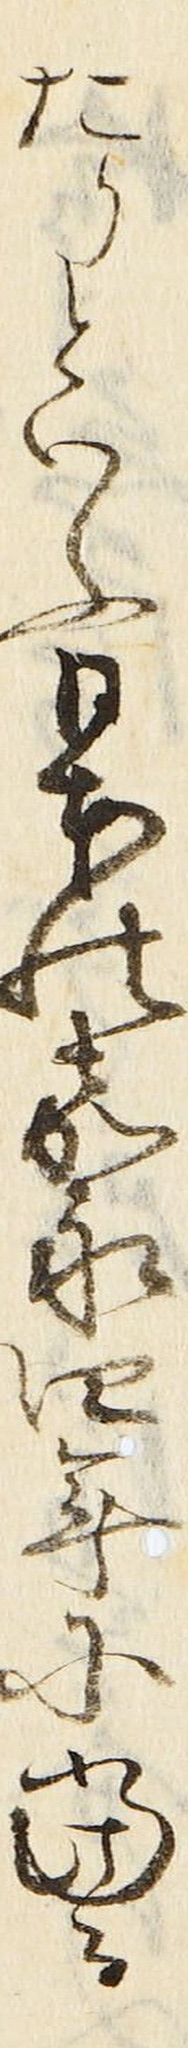たりといふ日本の嘉永四年に当る
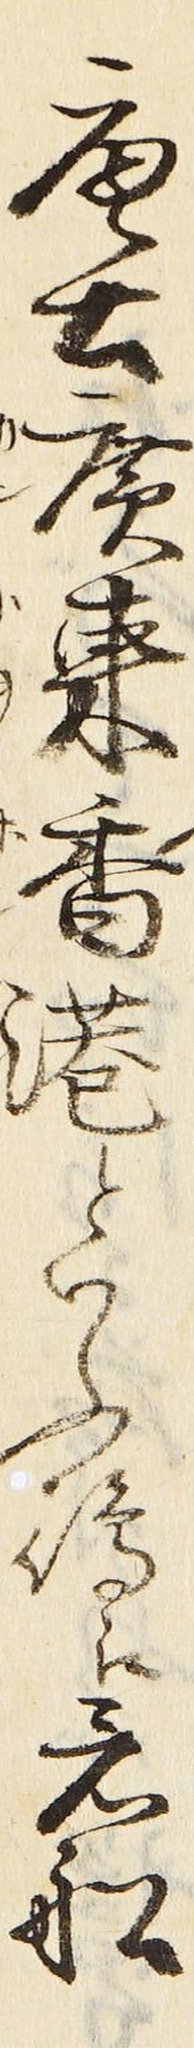唐土広東香港といふ島え着船
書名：亜墨利加漂流記聞
